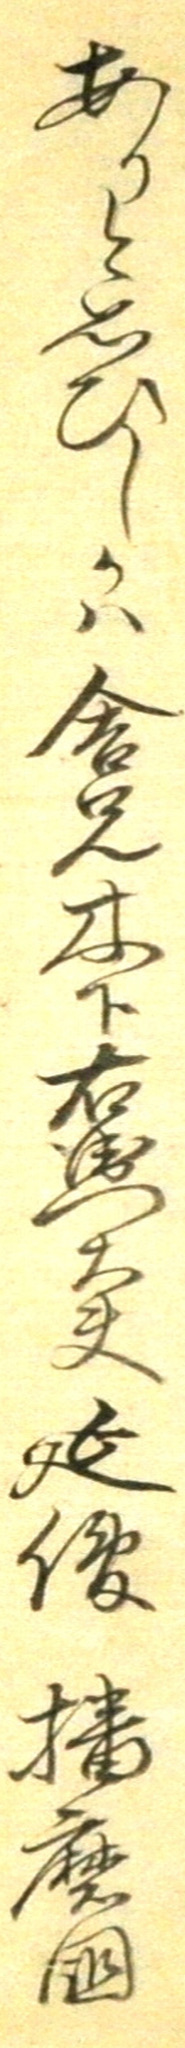ありと思ひしかは舎兄木下右右衛門大夫延俊播磨国
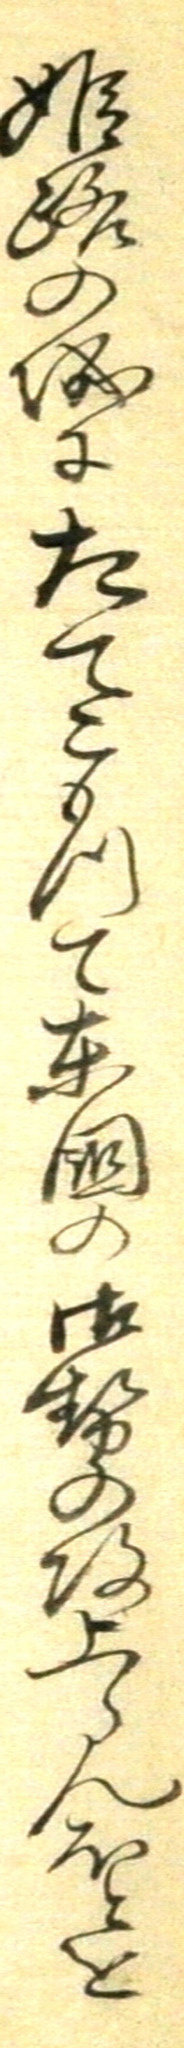姫路の城にたてこもつて東国の御勢の攻上らんほとを
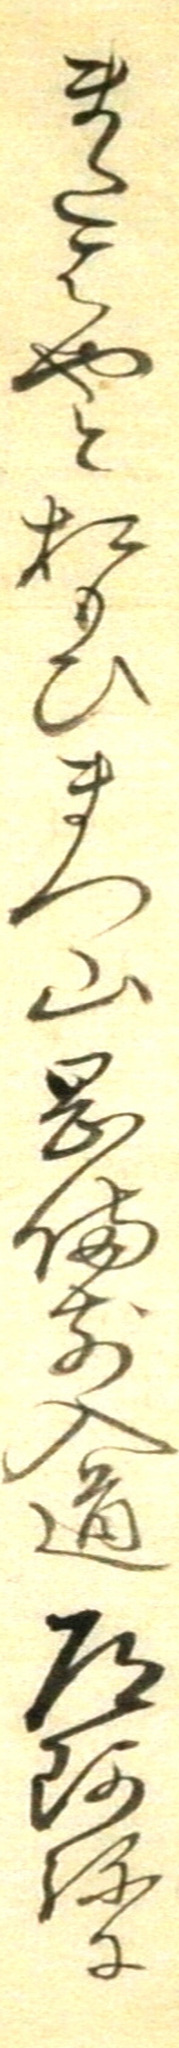またはやとおもひまつ山岡備前入道道阿弥に
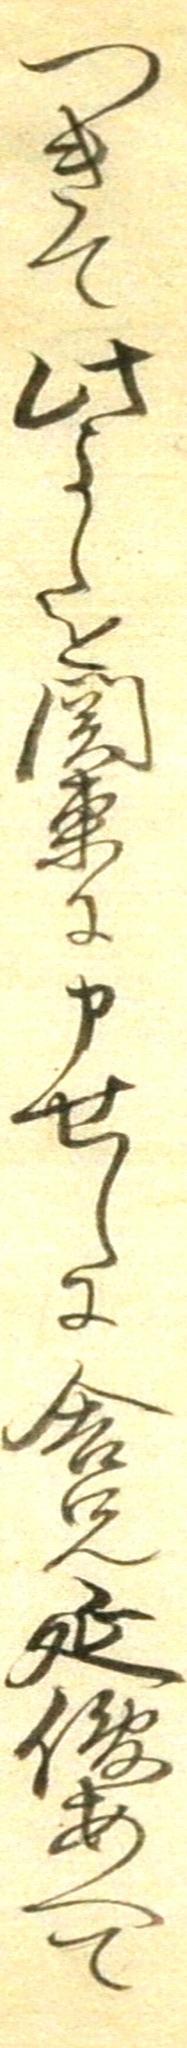つきて此よしを関東に申せしに舎兄延俊あへて
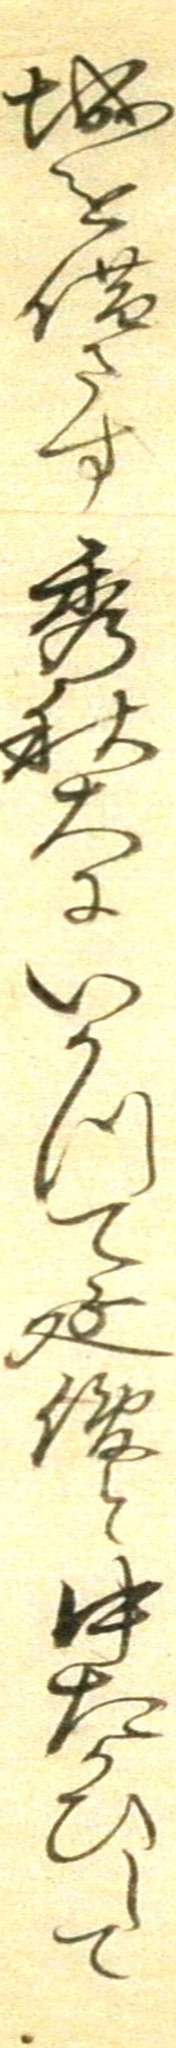城を借さす秀秋大にいかつて延俊と中たかひして
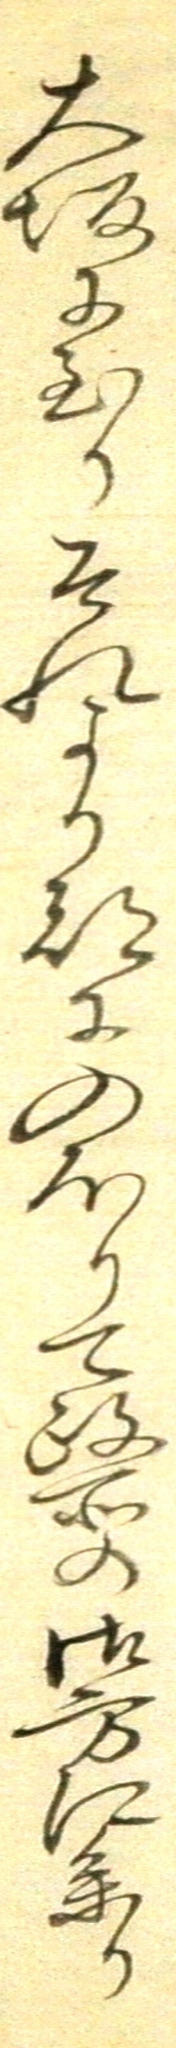大坂に至りそれより郡にのほりて政所の御方に参り
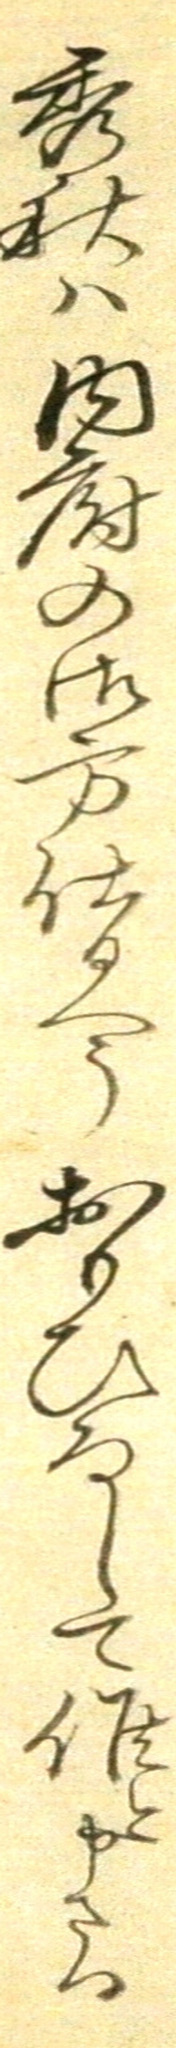秀秋は内府の御方仕るへうおもひなして候と申さる
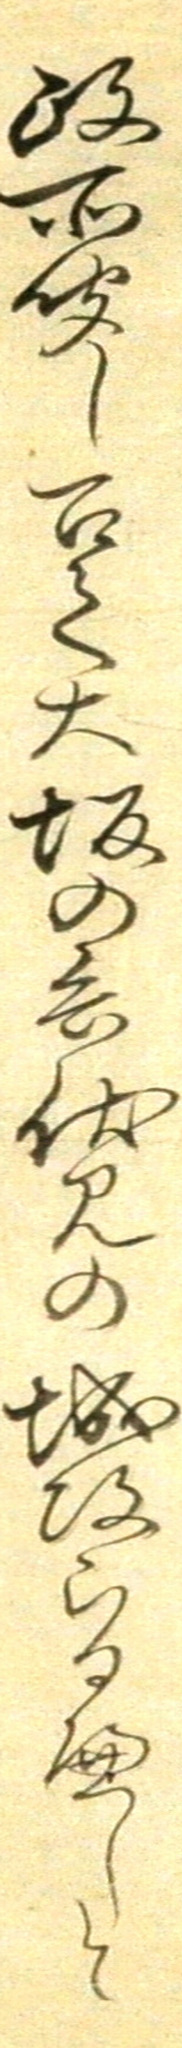政所聞し召て大坂の兵伏見の城攻らるへしと
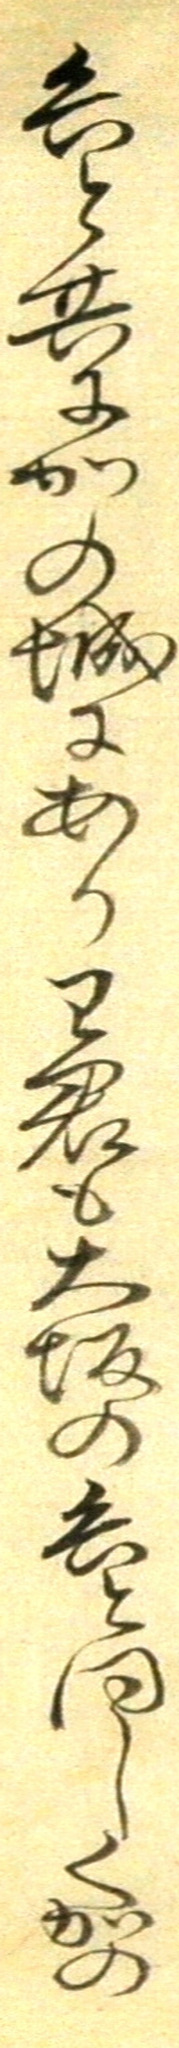兵と共にかの城にありわ君も大坂の兵と同しくかの
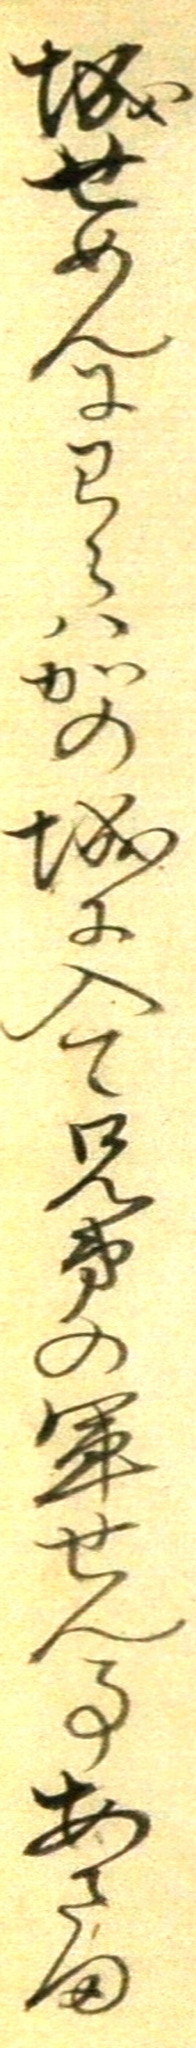城せめんにわらはかの城に入て兄弟の軍せん事あさま

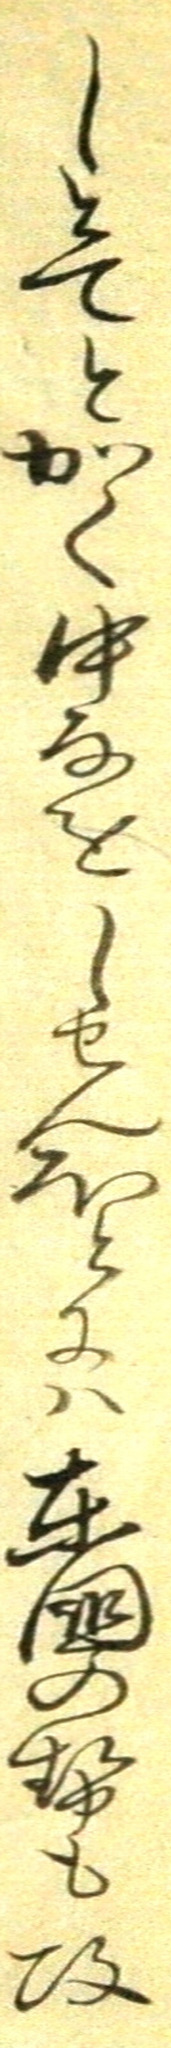しとてとかく中なをしせんほとには東国の勢も攻
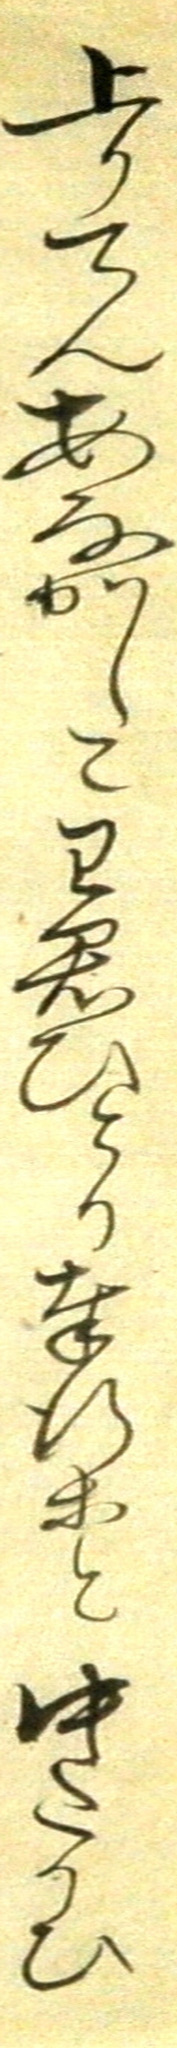上りてんあなかしこわ君ひとり奉行等と中たかひ
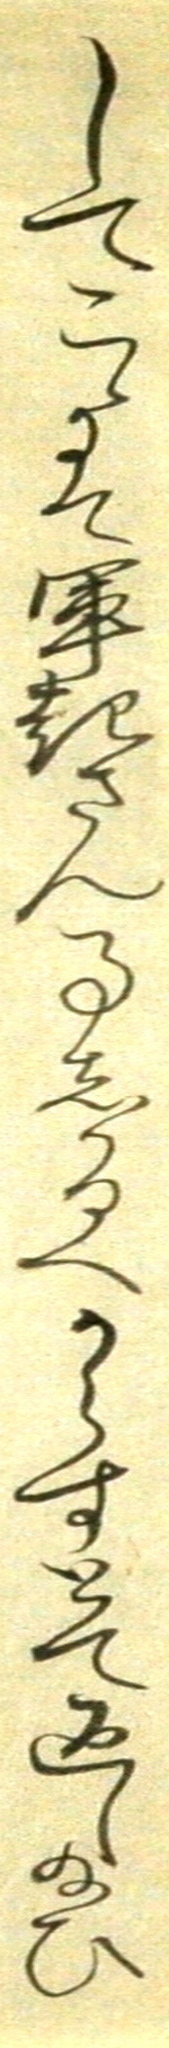してこゝにて軍起さん事しかるへからすとて返し給ひ
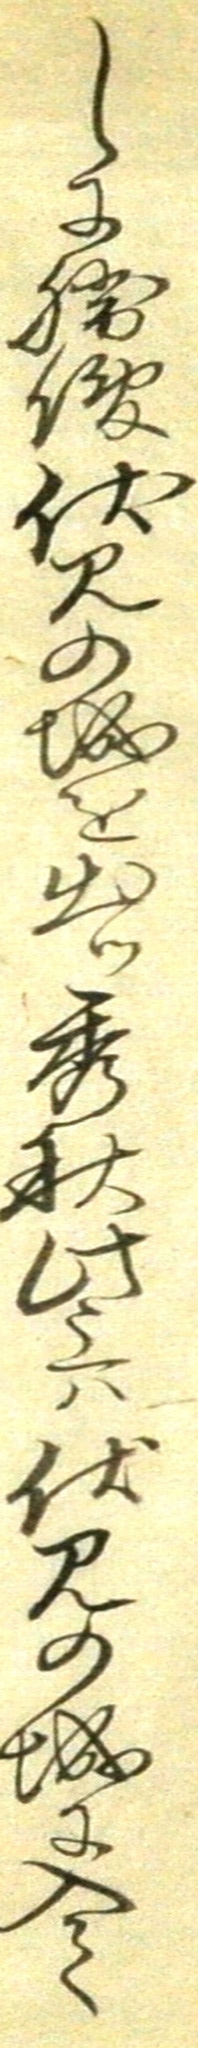しに勝俊伏見の城を出つ秀秋此うへは伏見の城に入て
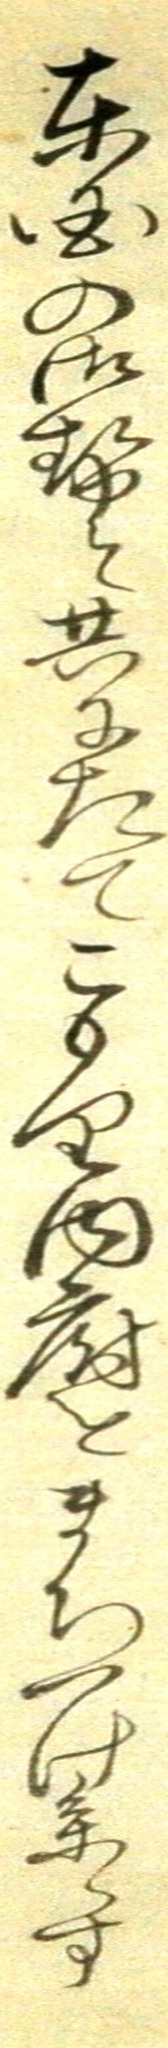東国の御勢と共にたてこもり内府をまちつけ参らす
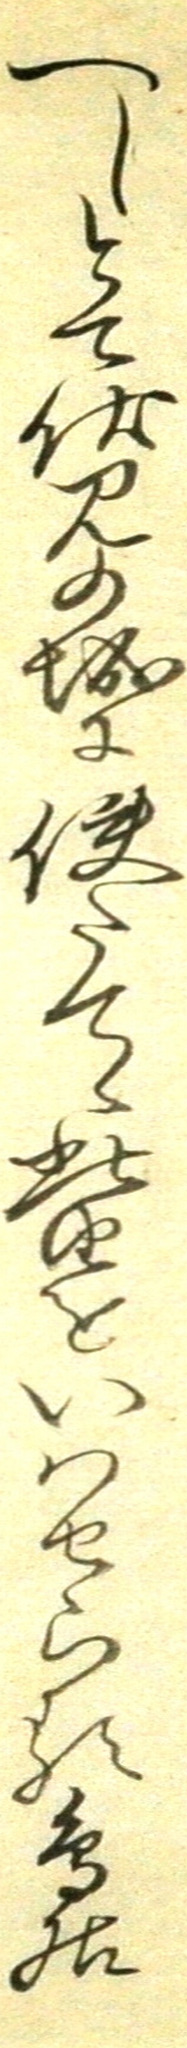へしとて伏見の城に使いたて候此由をいはせらる鳥居
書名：藩翰譜（十二・上）
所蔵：伊那市立高遠町図書館・合同会社AMANE
